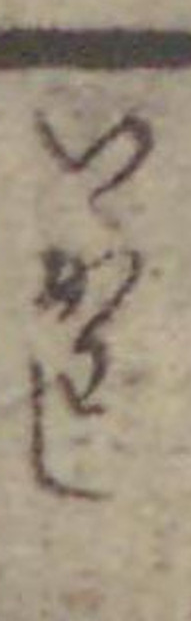いゝかわし
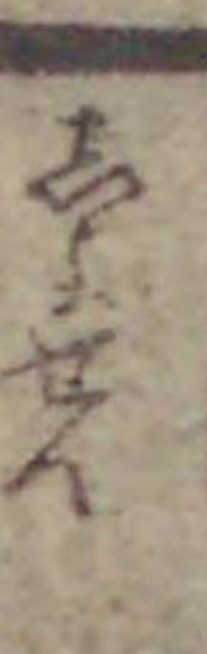しよせん
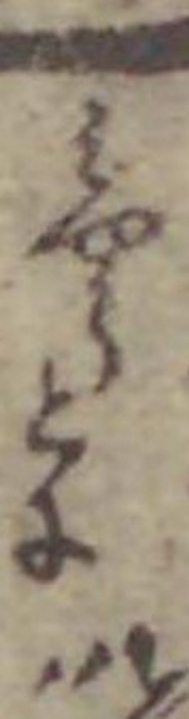ミやうとに
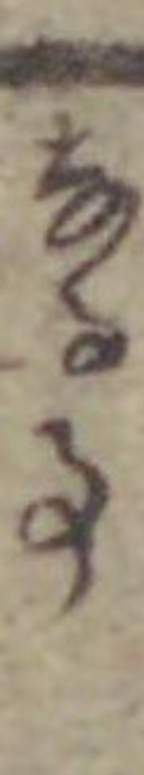なる事
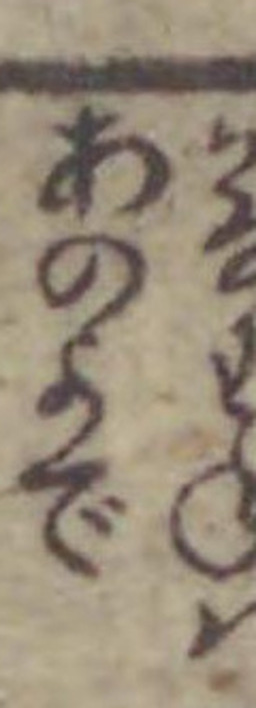あのよで
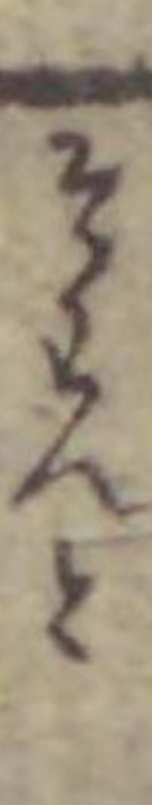そわんと
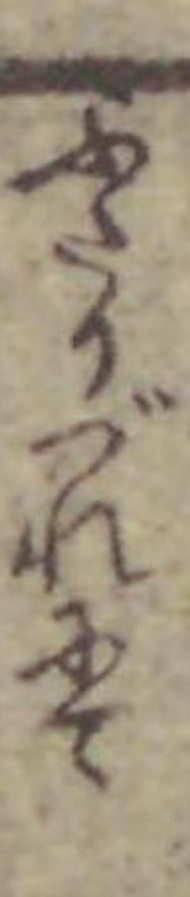ふたりづれにて
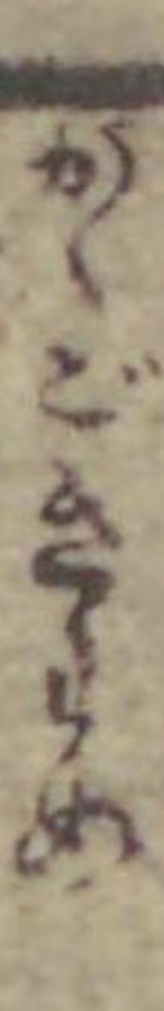かくごきわめ
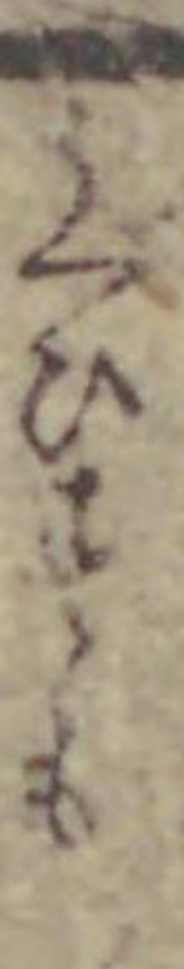うくひすも
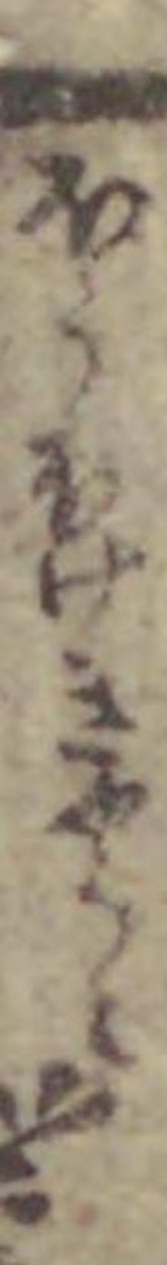ほうほけきやうと
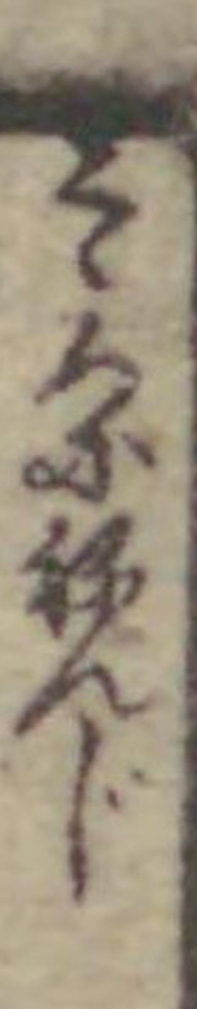こゝろにねんじ
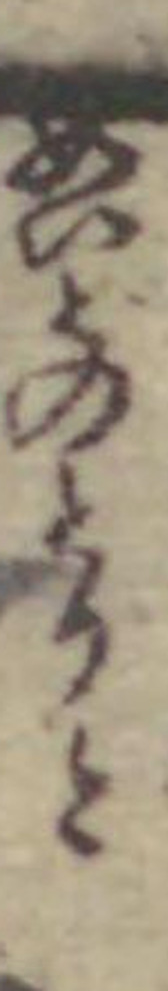めいどのとりと
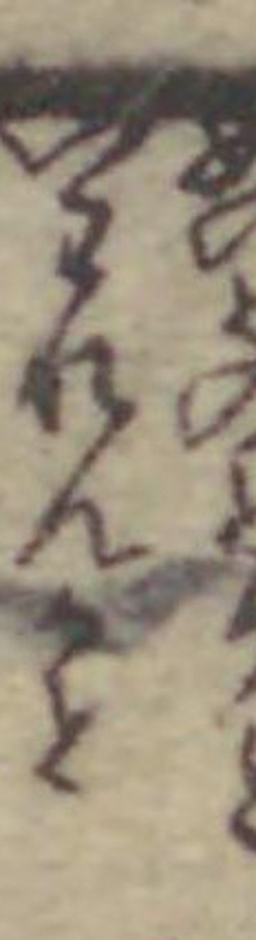いわれんかと
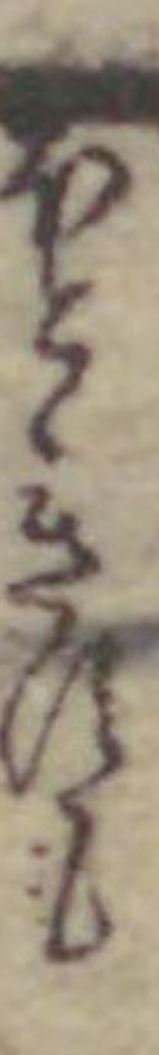ほとゝきすも
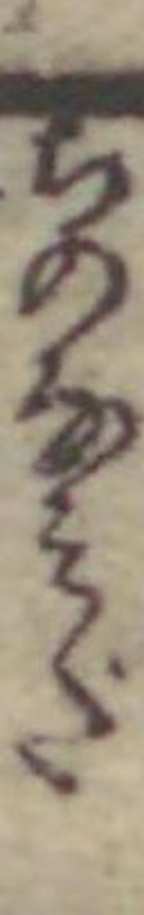ちのなミだ
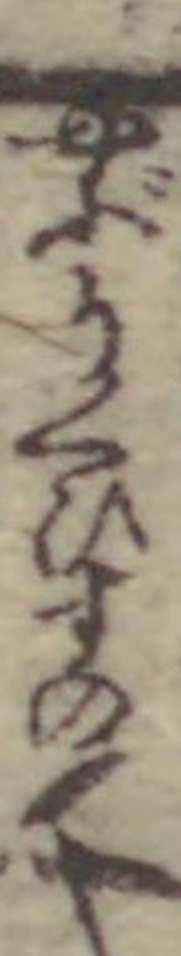やぶうくひすの
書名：烏行水諺草 3巻
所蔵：国立国会図書館 National Diet Library, JAPAN
